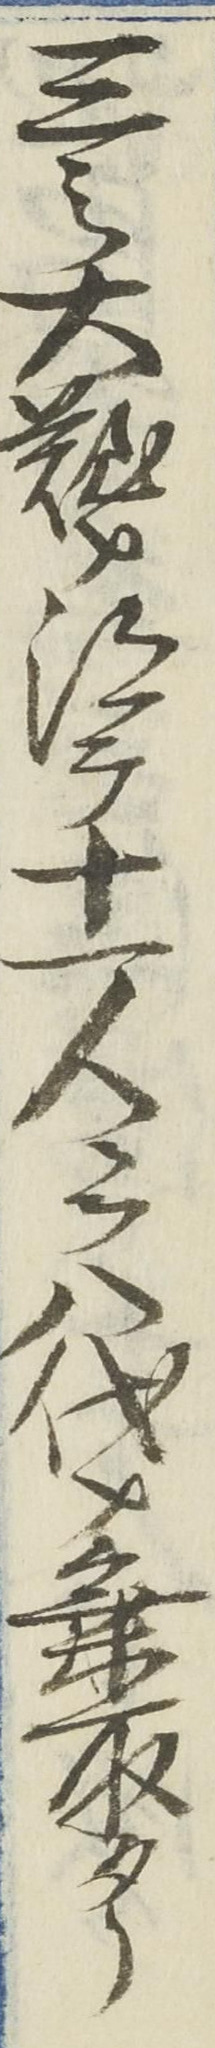三之大難を治テ十一人テ八代を乗取タリ
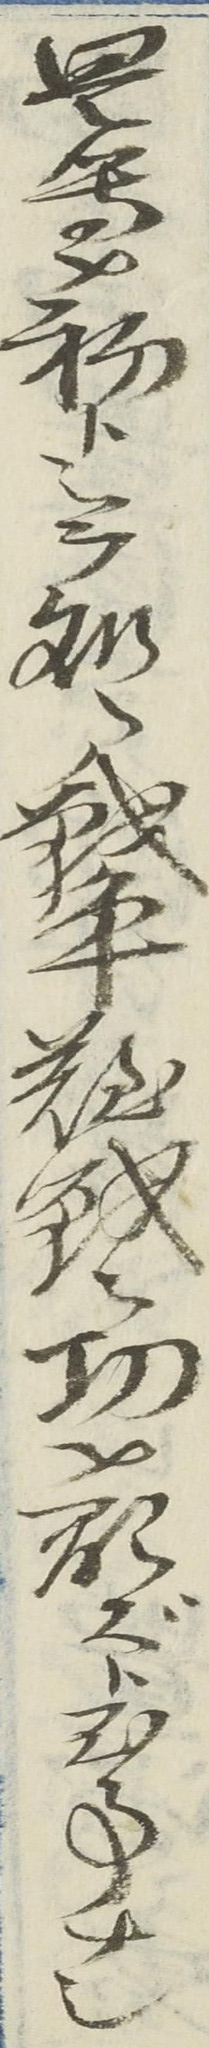是等ヲ初トシテ処々戦争難戦ニ功を顕ズト云事ナシ
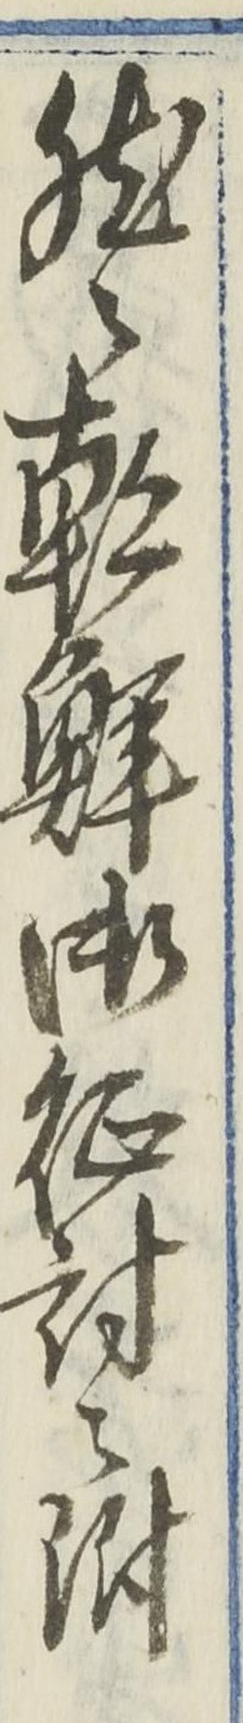然ニ朝鮮御征討ニ附
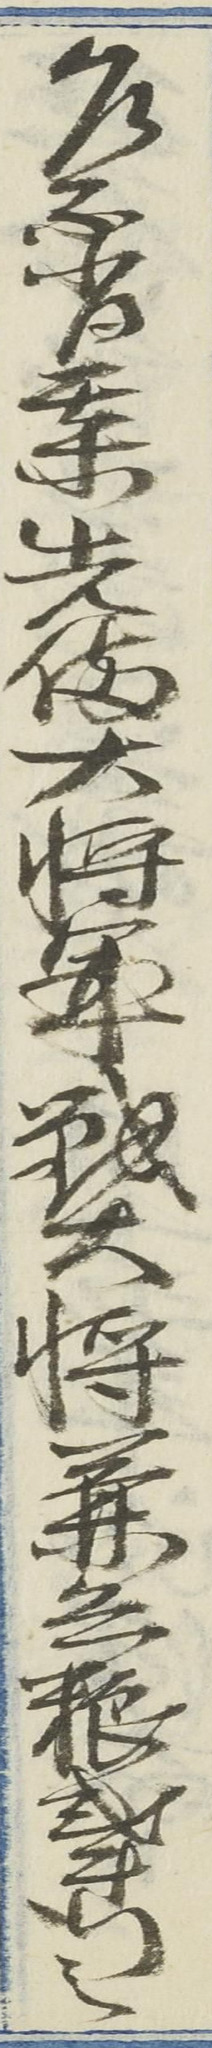乍不肖某先備代将軍戦大将兼兵粮奉行之
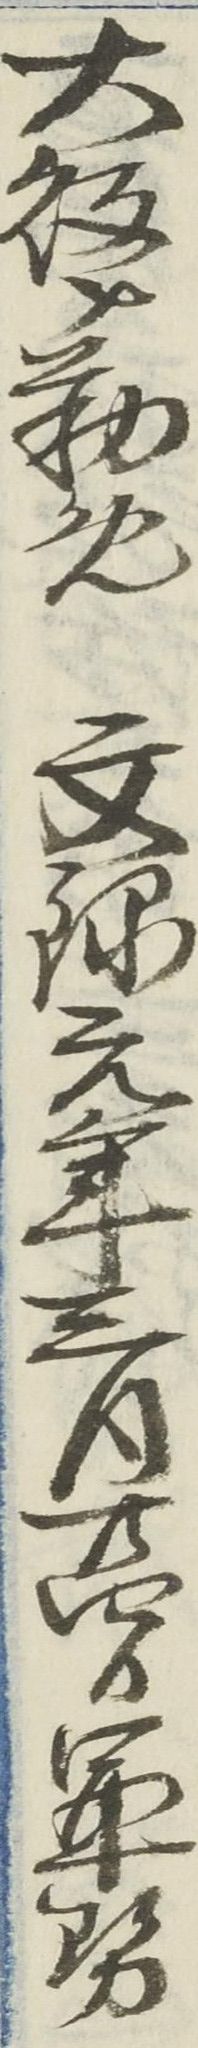大役を勤め文禄元年三月二十四日軍勢
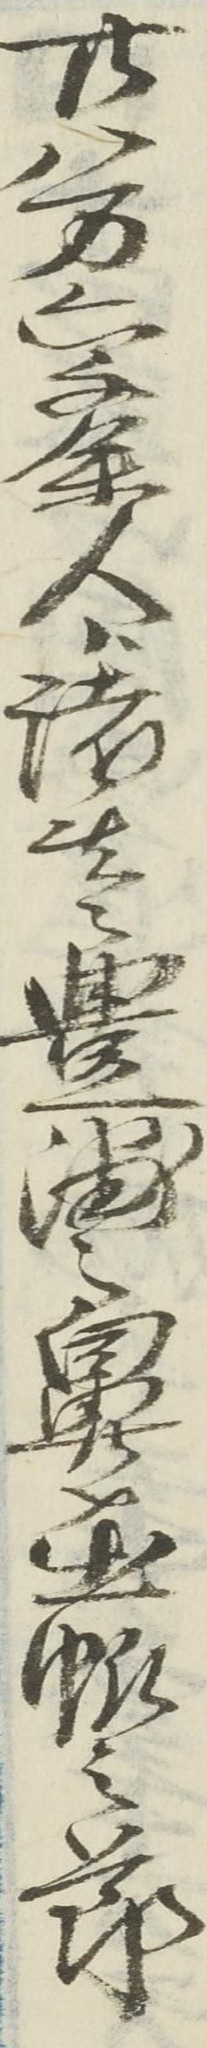廿八万六千余人ト諸共ニ豊浦之鼻ヲ出帆之節
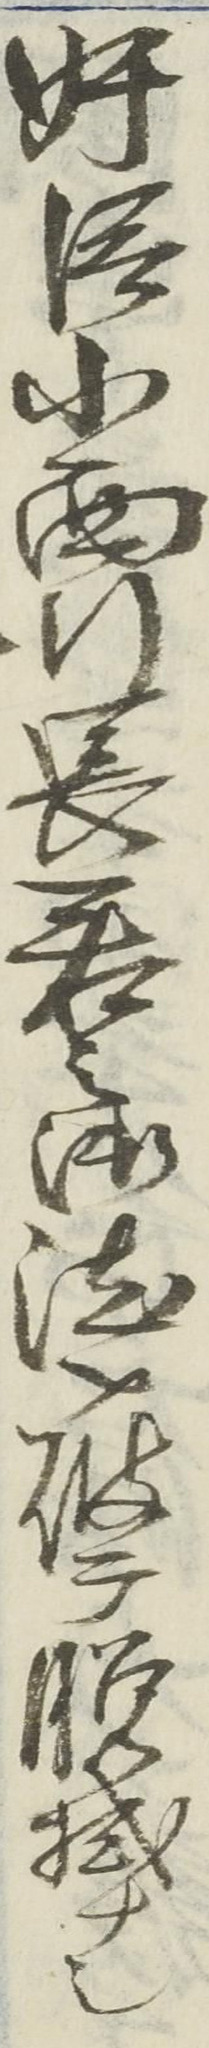奸臣小西行長君之御法ヲ破テ脱掛ナシ
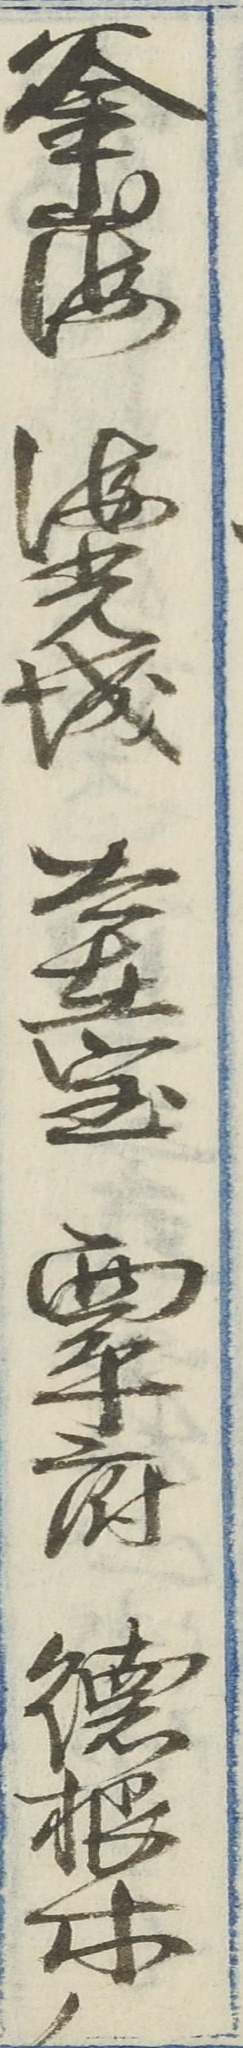釜山海海光城太在宝西平府徳根木
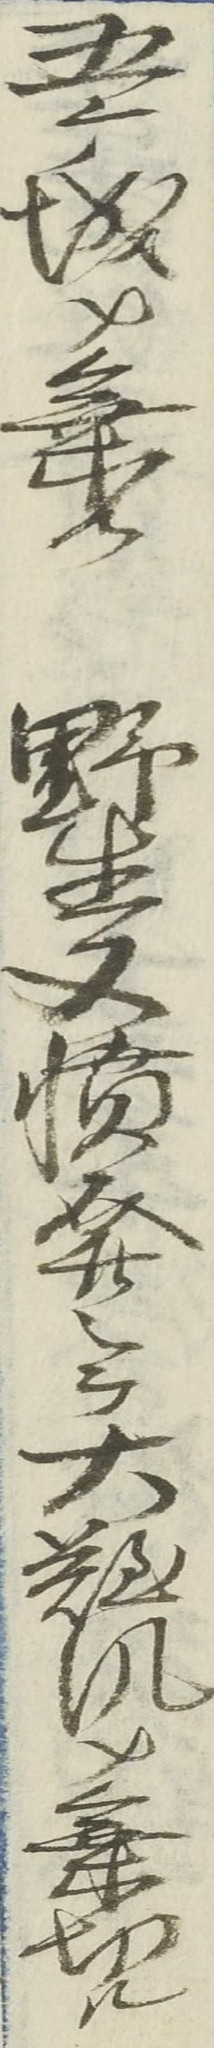五ケ城ヲ乗ル野生又憤発シテ大難風を乗切ル
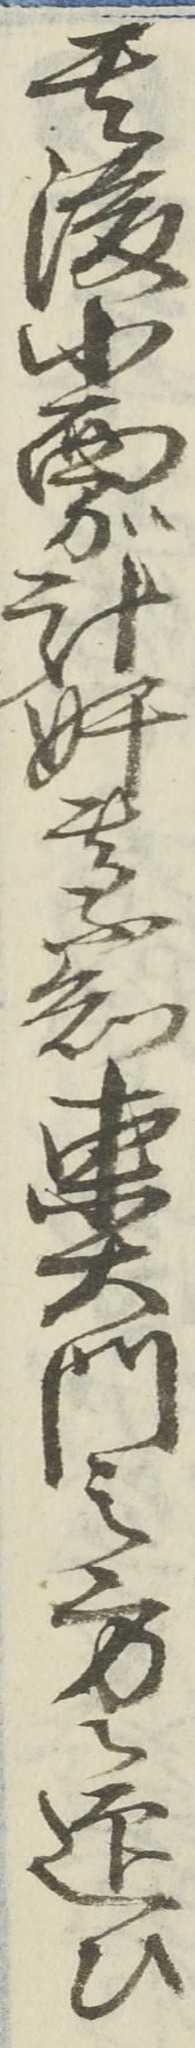其後小西が奸計共不知東大門之方ニ迎ひ
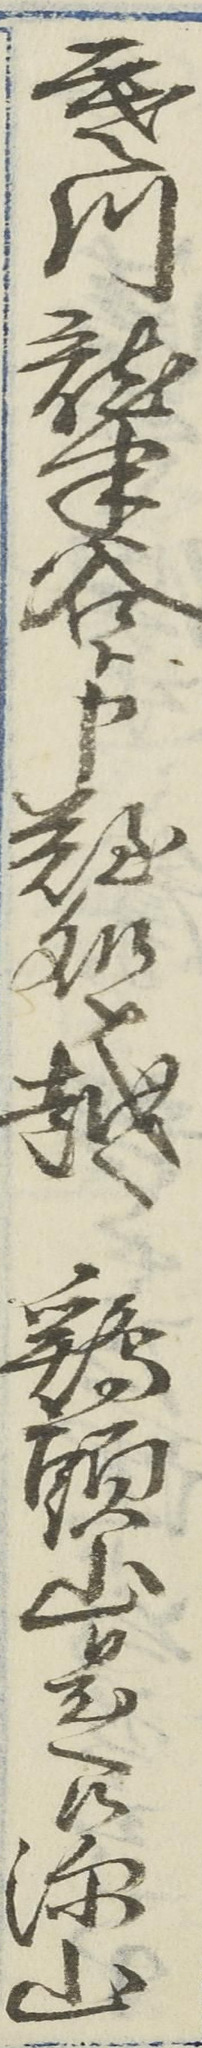川龍半谷ト申難処ヲ越ヘ鶏頭山ト云へル深山
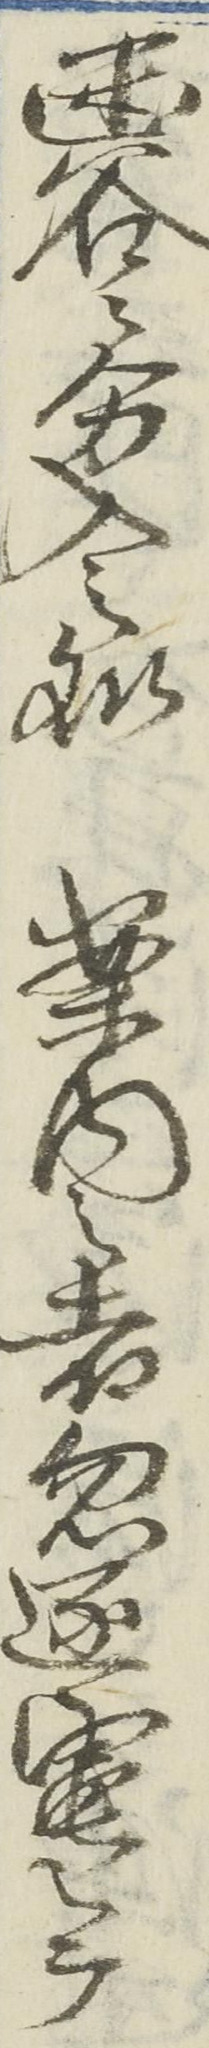幽谷ニ分入之処案内之者忽逐電して
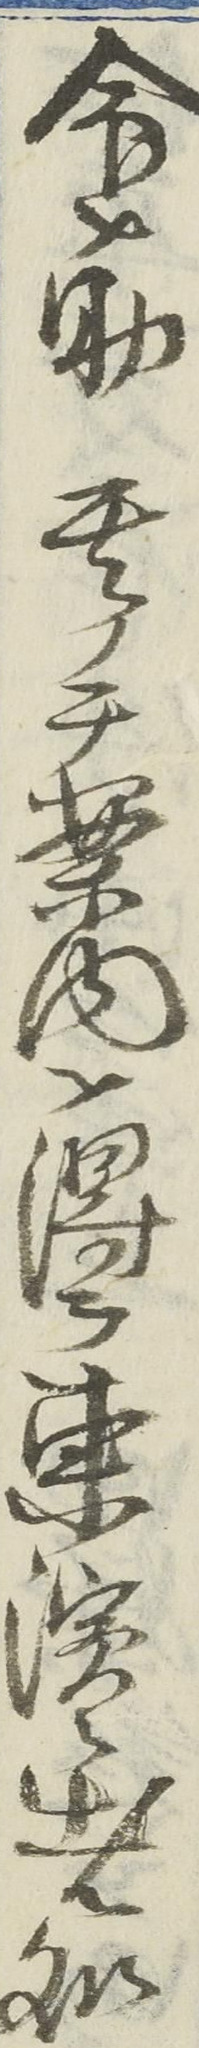命ヲ助其ノチ案内ヲ得テ東浜ニ出ル処
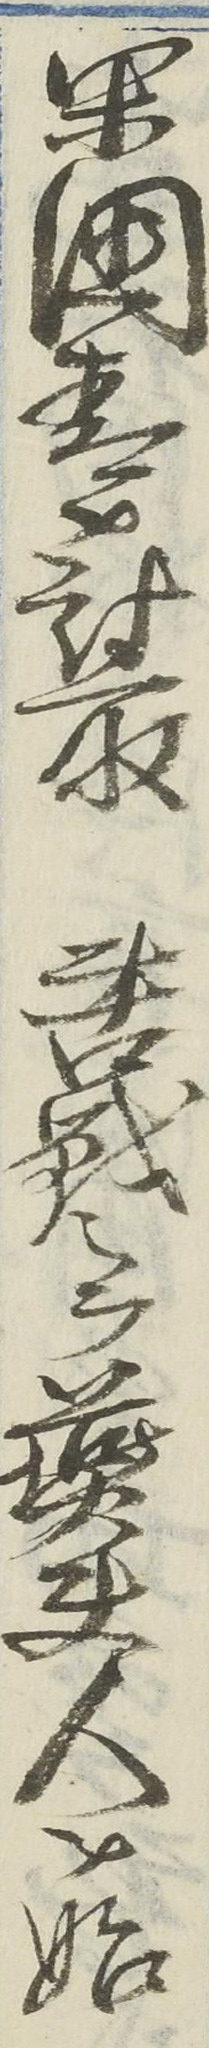果国春ヲ討取苦戦シテ燕夫人ヲ始
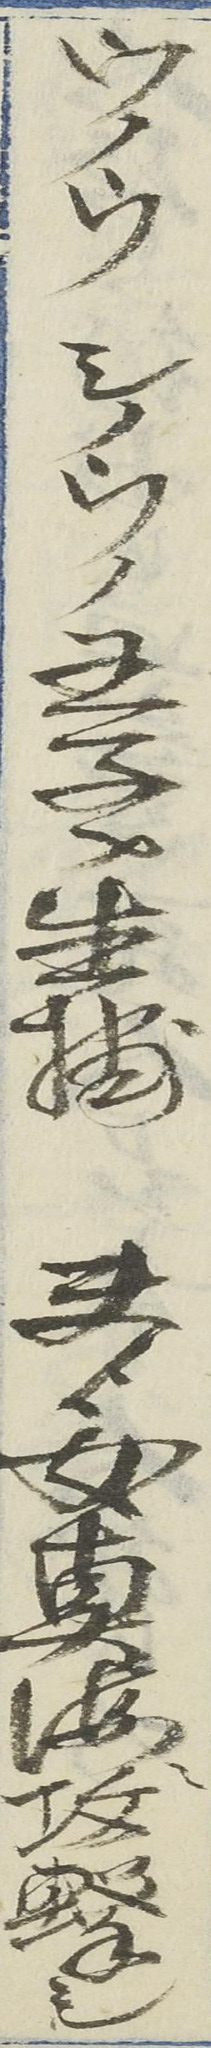ウノウシノウノ王子を生捕夫ゟ女真海攻撃シ
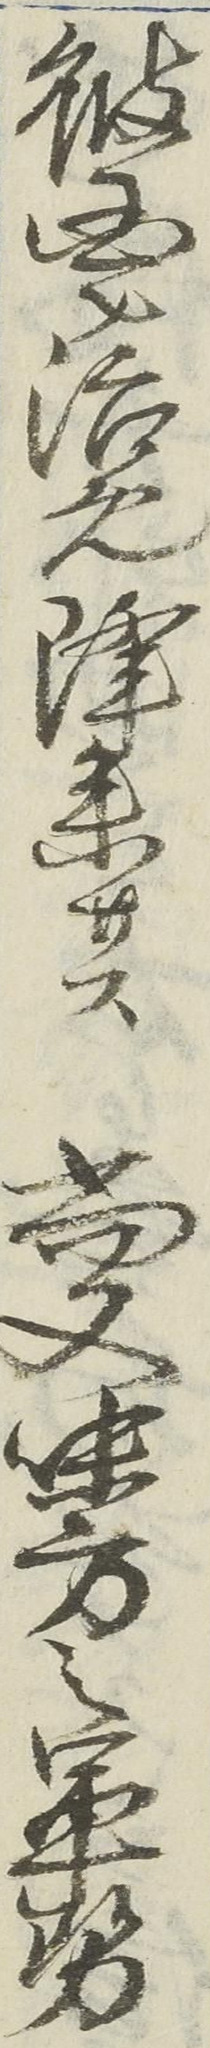彼国ヲ治め降参サス尚又味方之軍勢
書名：伏水大地震
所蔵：東京大学地震研究所図書室 Earthquake Research Institute Library, The University of Tokyo, JAPAN
